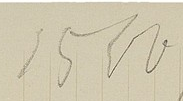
Herr u.
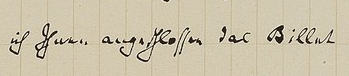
ich Ihnen angeschlossen das Billet
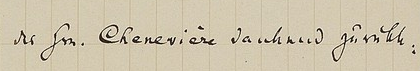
des Hrn. Chenevière dankend zurükk-
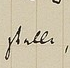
stelle,
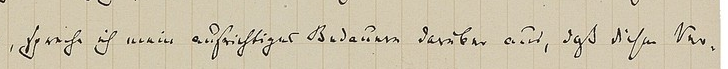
spreche ich mein aufrichtiges Bedauern darüber aus, daß dieser Ver-
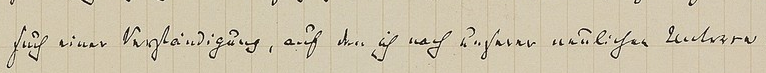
such einer Verständigung, auf den ich nach unserer neulichen Unterre-
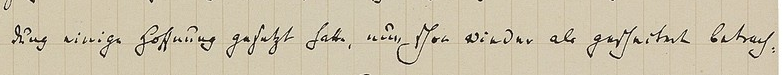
dung einige Hoffnung gesetzt hatte, nun schon wieder als gescheitert betrach-
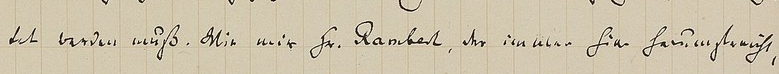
tet werden muß. Wie mir Hr. Rambert, der immer hier herumstreicht,
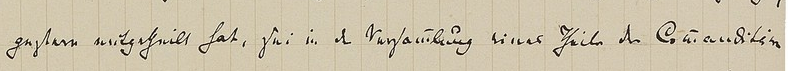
gestern mitgetheilt hat, sei in der Versammlung eines Theils der Commanditäre
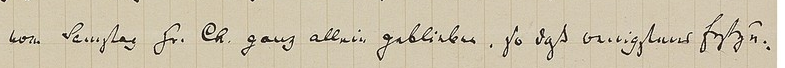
vom Samstag Hr. Ch. ganz allein geblieben, so daß wenigstens festzu-
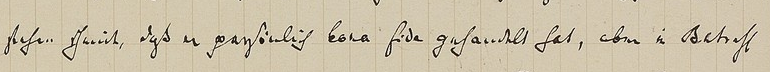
stehen scheint, daß er persönlich bona fide gehandelt hat, aber in Betreff
